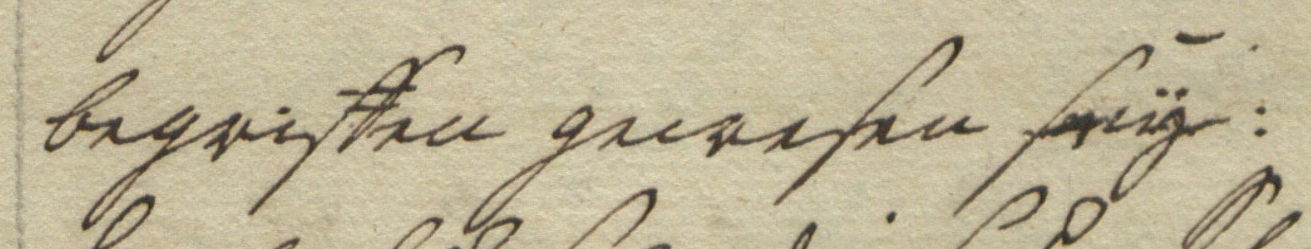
begriffen gewesen seÿ:
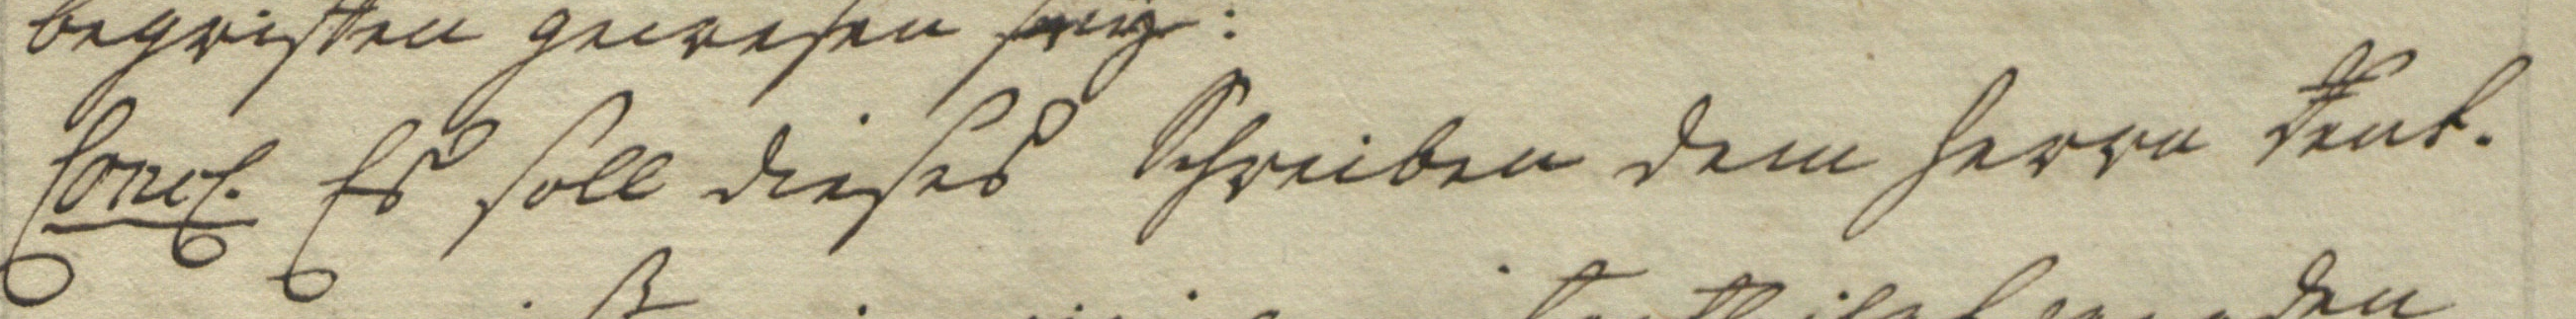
Concl. Es soll dieses Schreiben dem Herrn Rent¬
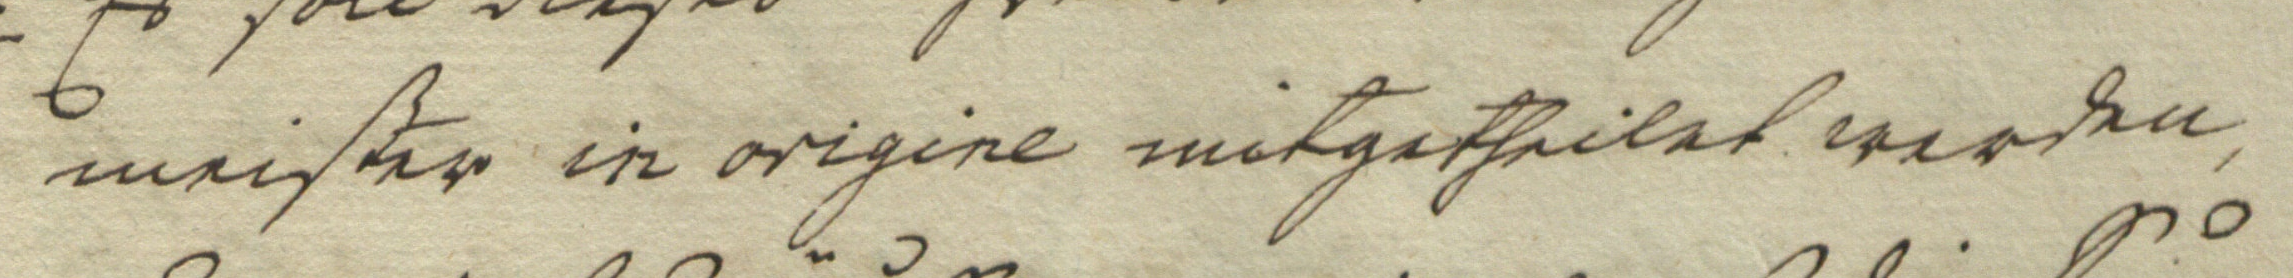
meister in origine mitgetheilet werden,
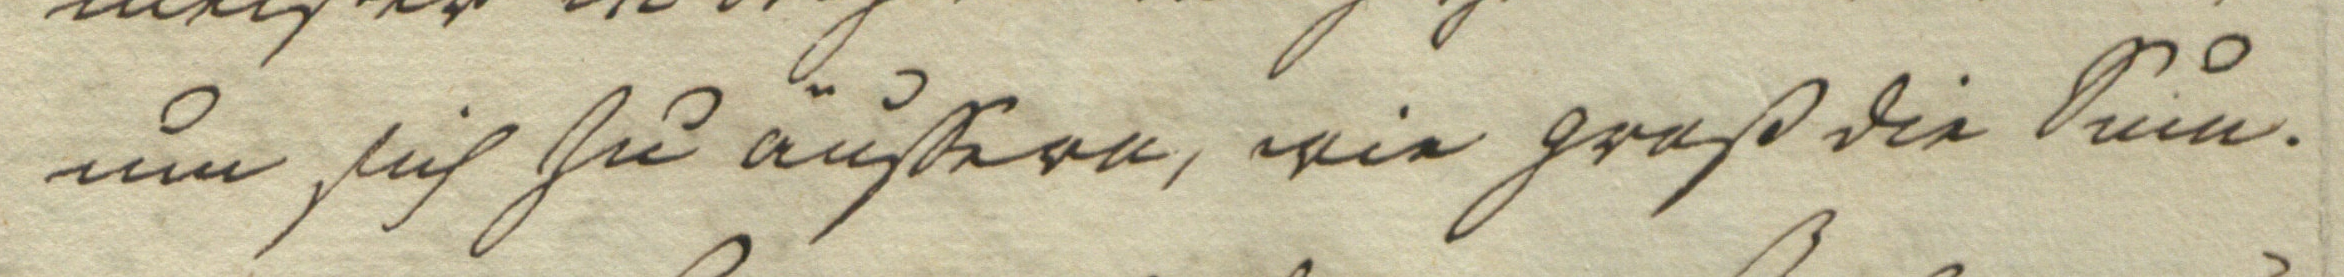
um sich zu äussern, wie groß die Sum¬
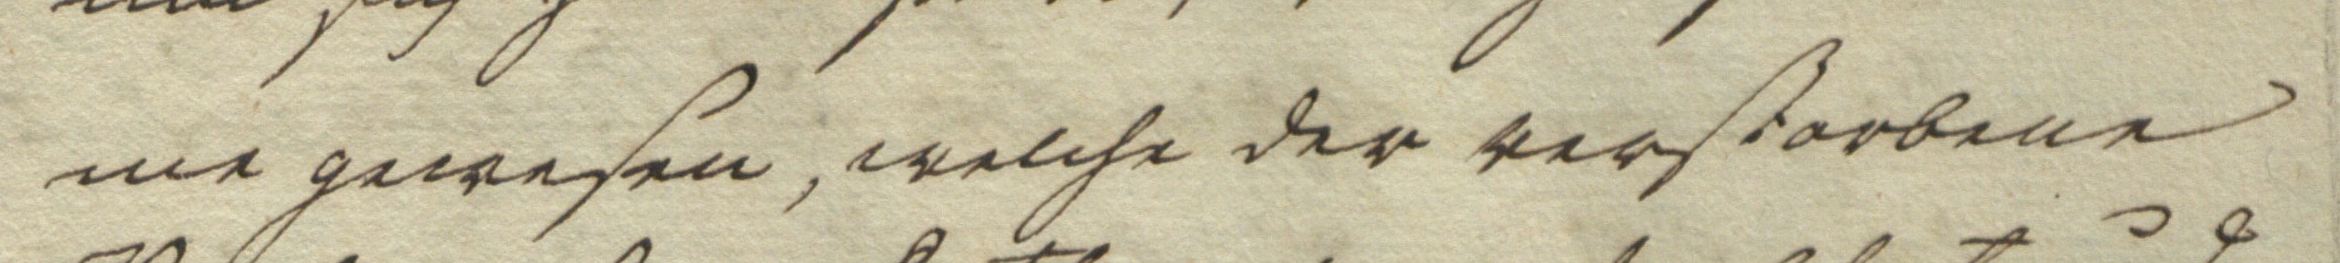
me gewesen, welche der verstorbene
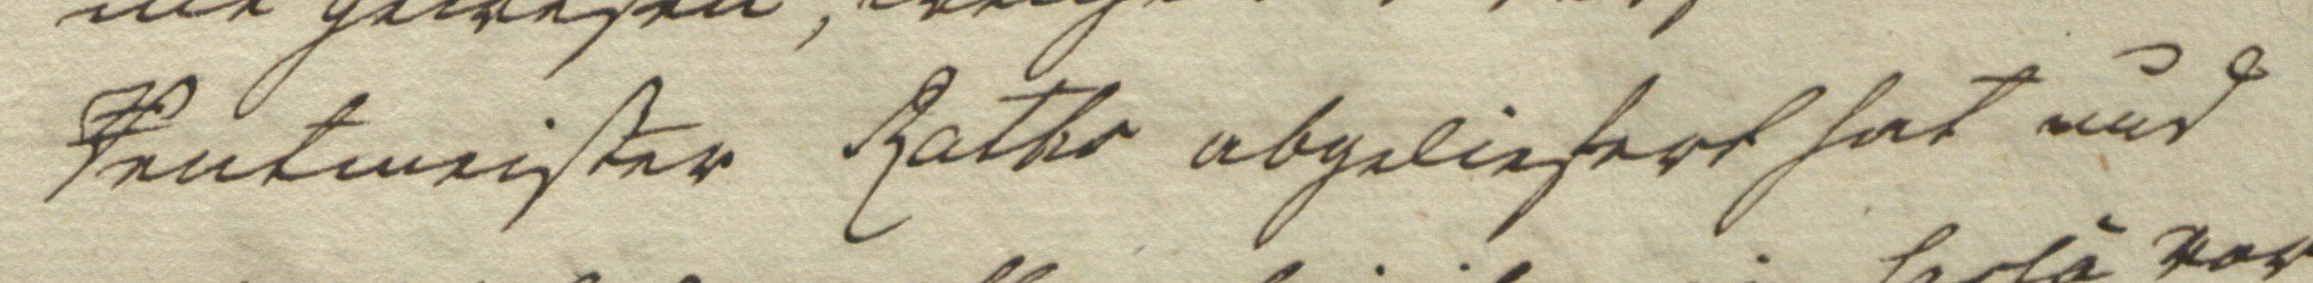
Rentmeister Raths abgeliefert hat und
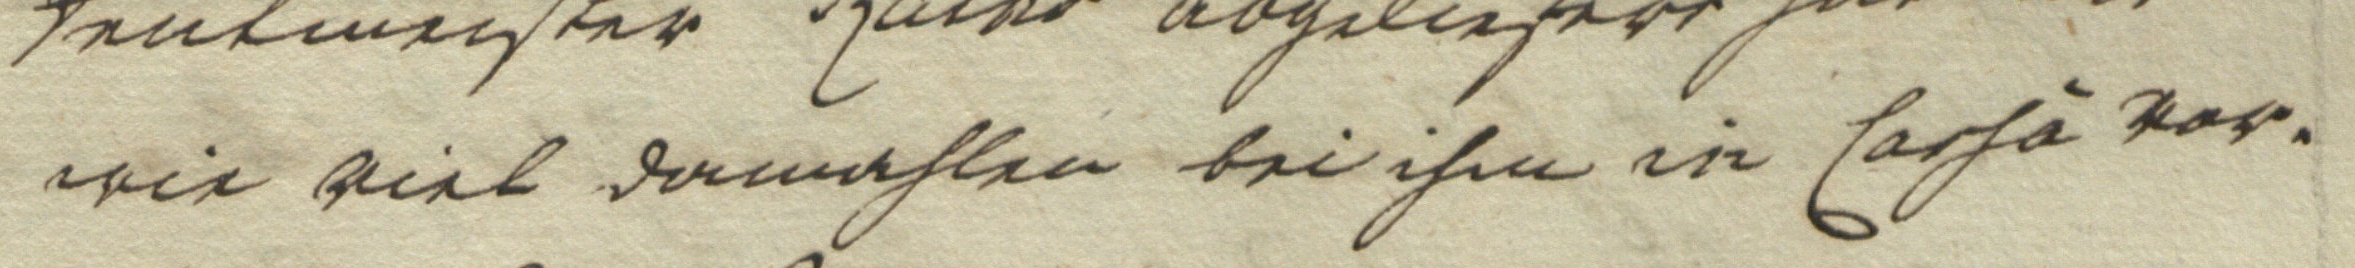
wie viel damnahlen bei ihm in Cassa vor¬
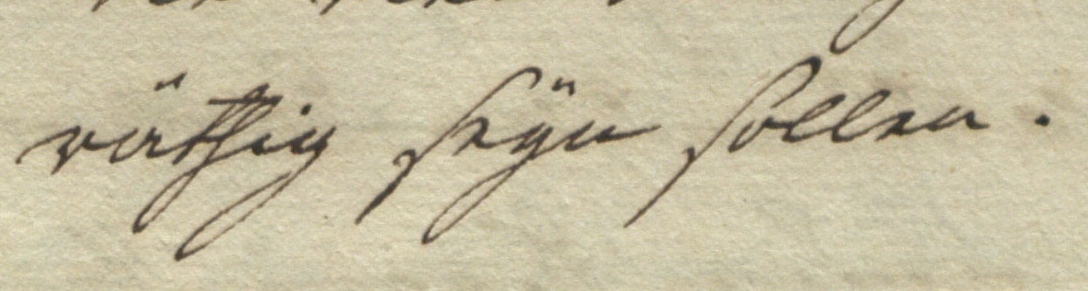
räthig seÿn sollen.
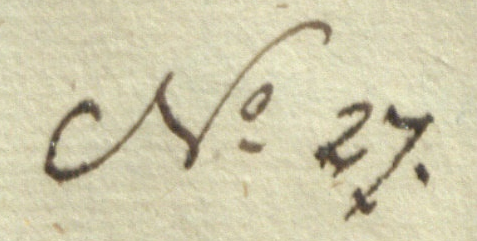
No 27.
